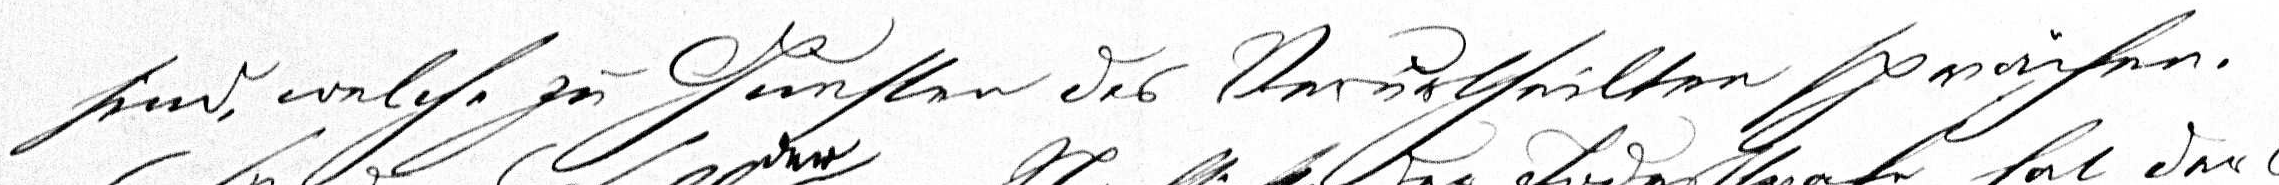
sind, welche zu Gunsten des Verurtheilten sprächen.
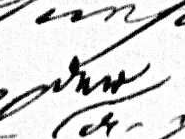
der
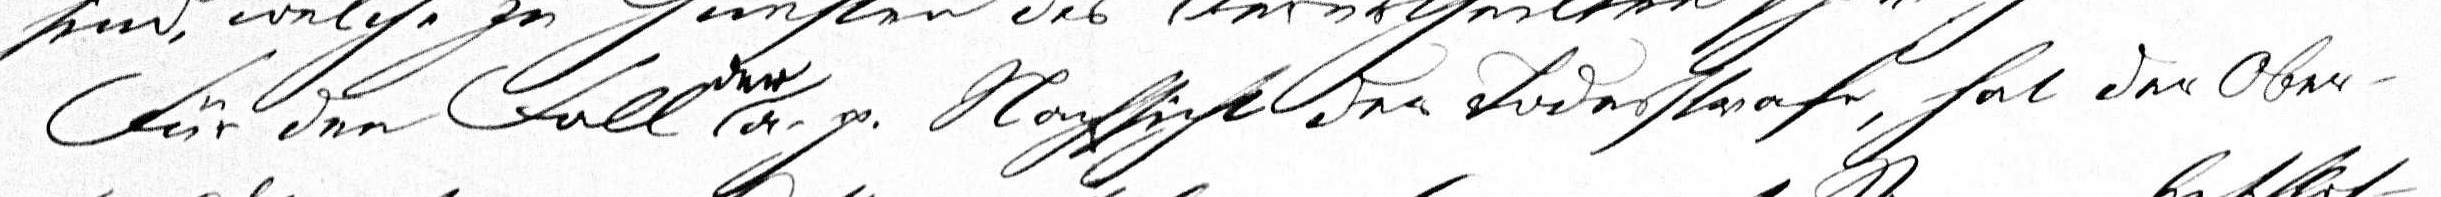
Für den Fall a.g. Nachsicht der Todesstrafe, hat der Ober¬
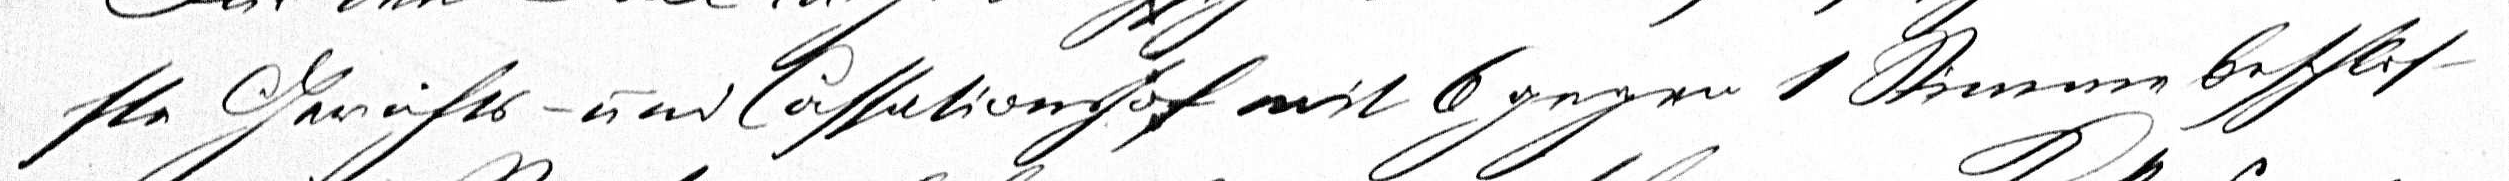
ste Gerichts- und Cassationshof mit 6 gegen 1 Stimme beschlos¬
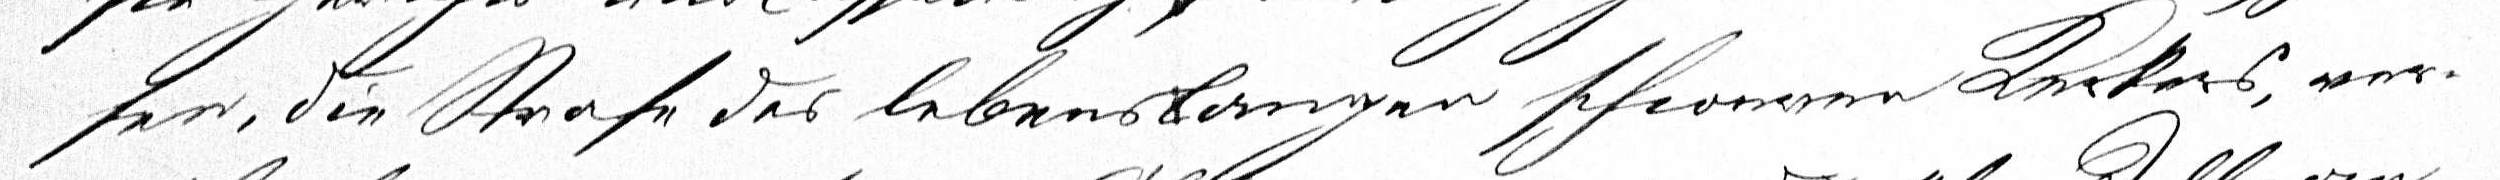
sen, die Strafe des lebenslangen schweren Kerkers, ver¬
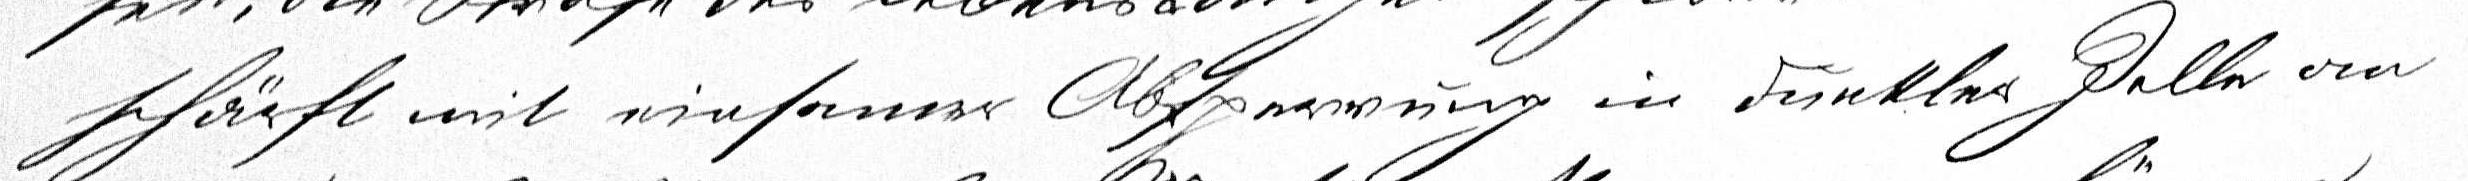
schärft mit einsamer Abperrung in dunkler Zelle an
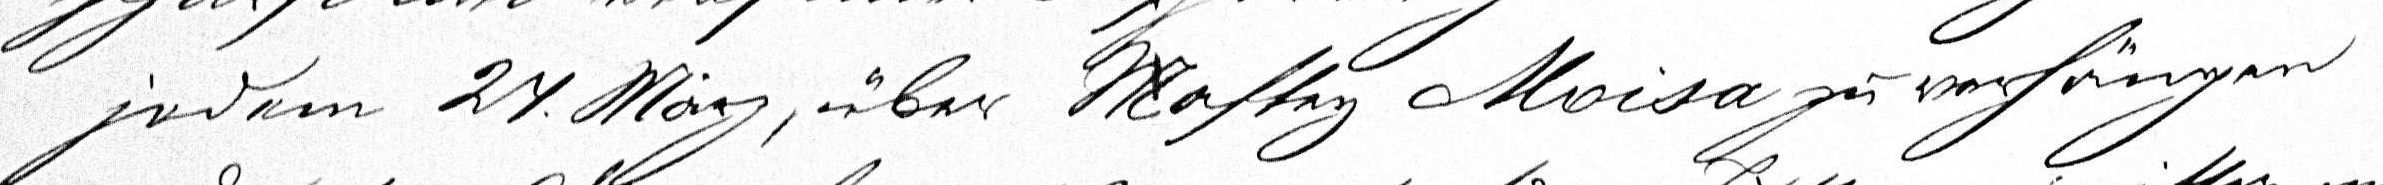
jedem 24. März, über Maftey Moisa zu verhängen
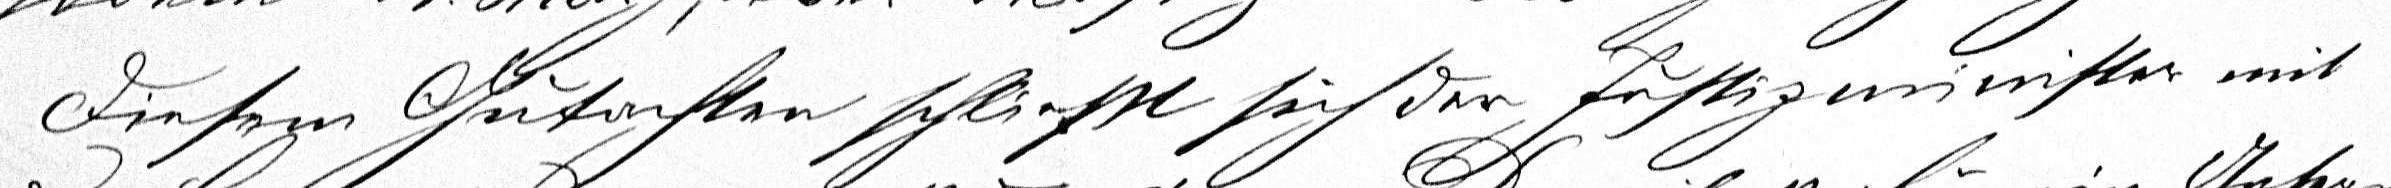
diesem Gutachten schließt sich der Justizminister mit
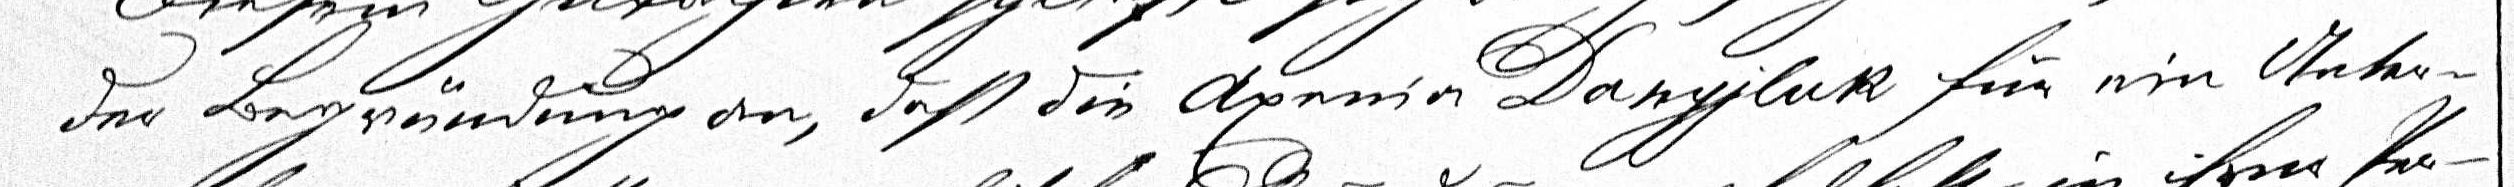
der Begründung an, daß die Axenia Danyjluk für ein Unter¬
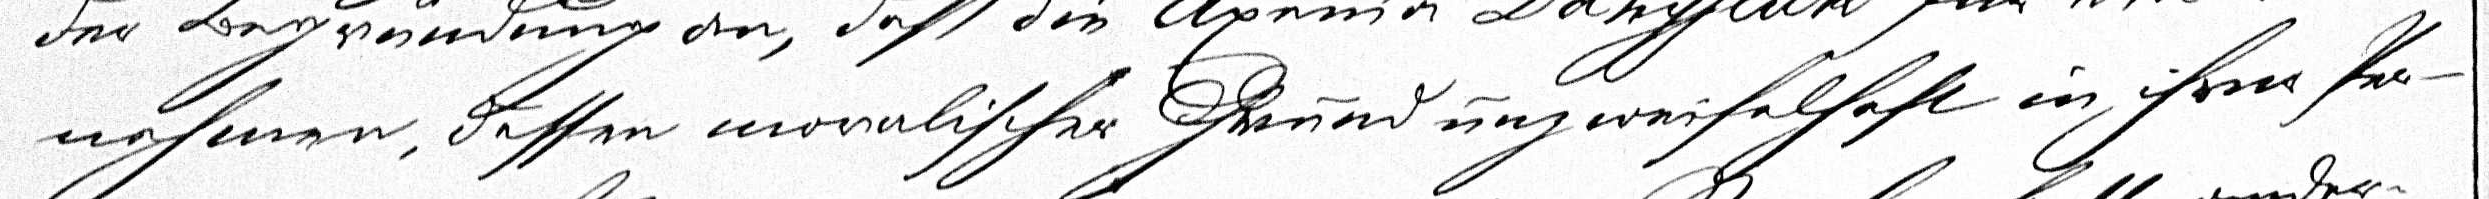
nehmen, dessen moralischer Grund unzweifelhaft in ihre Per¬
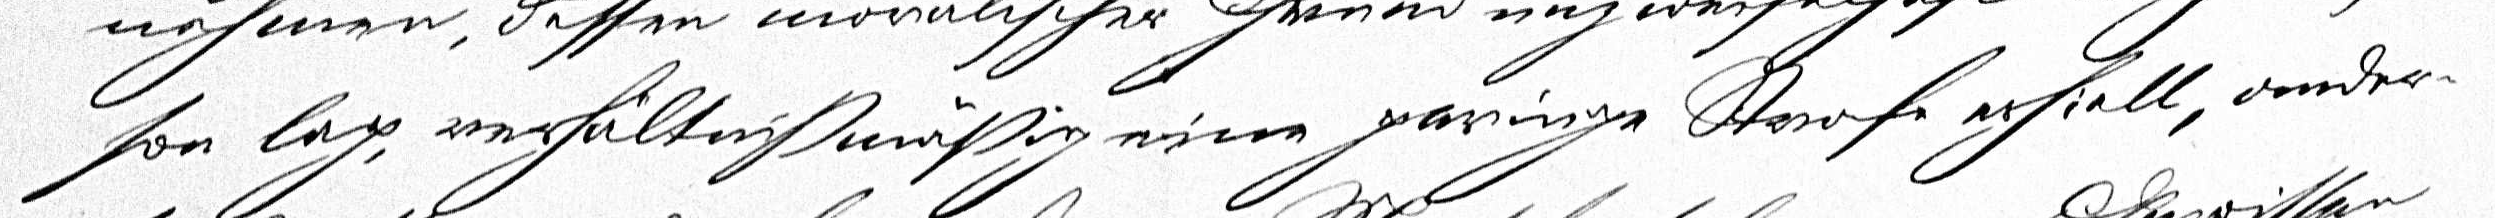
son lag, verhältnißmäßig eine geringe Strafe erhielt, ander¬
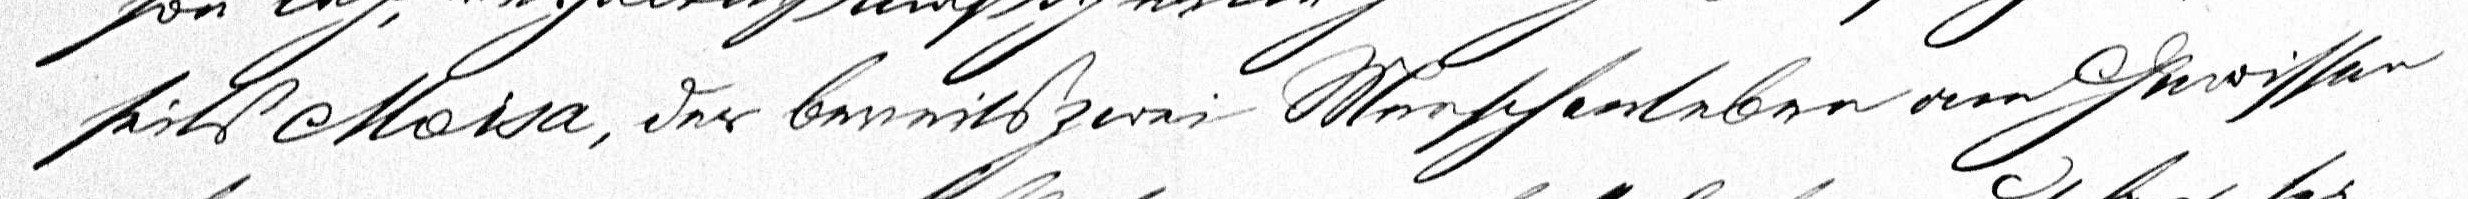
seits Moisa, der bereits zwei Menschenleben am Gewissen
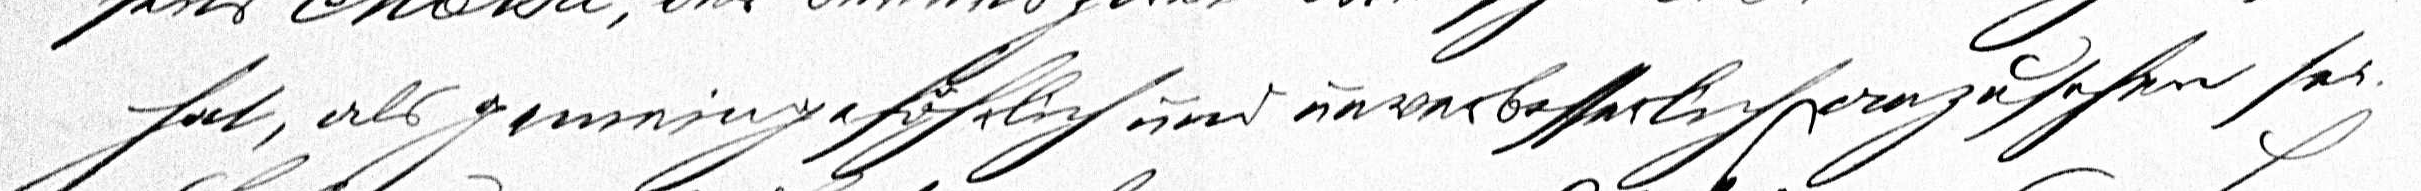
hat, als gemeingefährlich und unverbesserlich anzusehen sei.
